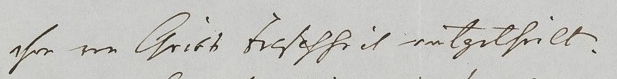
chen von Grobs Frechheit mitgetheilt.
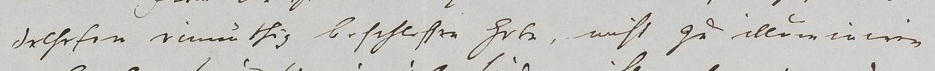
delhofen einmüthig beschlossen habe, nicht zu illuminiren
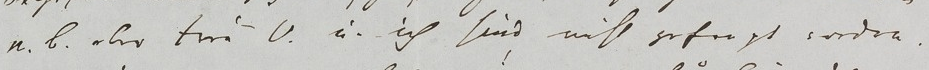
n. b. aber Frei-V. u. ich sind nicht gefragt worden.
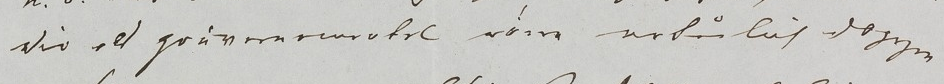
Wir als gouvernemental wären natürlich dagegen
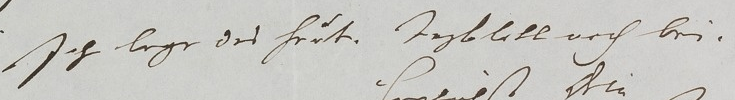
Ich lege das heut. Tagblatt noch bei.
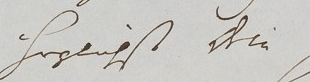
Herzlichst Dein
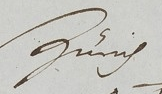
Zürich
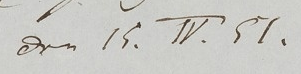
den 15. IV. 51.
